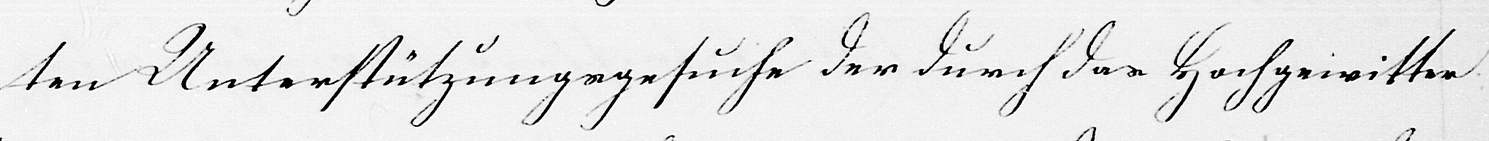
ten Unterstützungsgesuche der durch das Hochgewitter
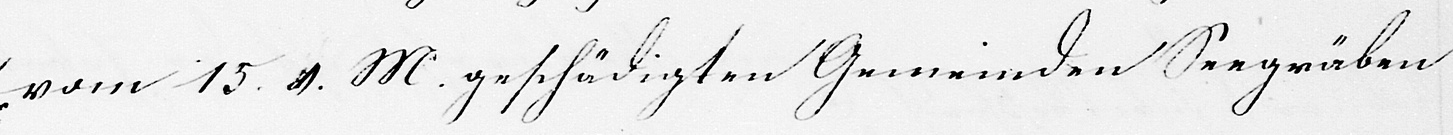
vom 15. v. M geschädigten Gemeinden Seegräben
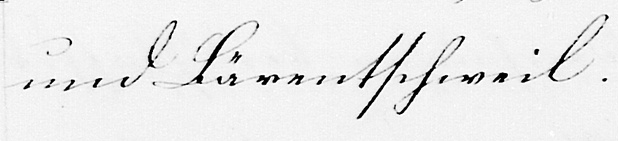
und Bärentschweil.
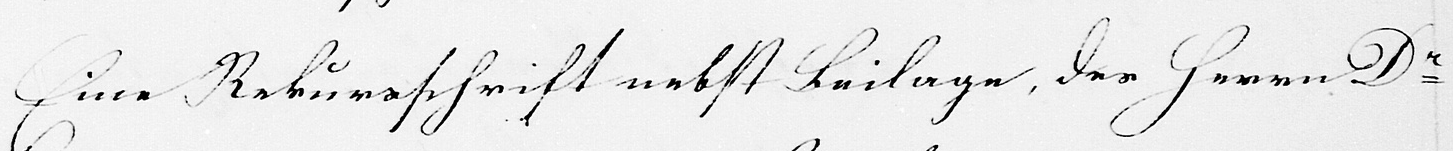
Eine Rekursschrift nebst Beilage, des Herrn Dr
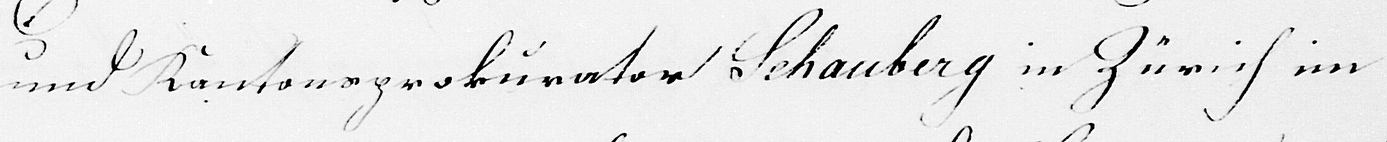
und Kantonsprokurator Schauberg in Zürich im
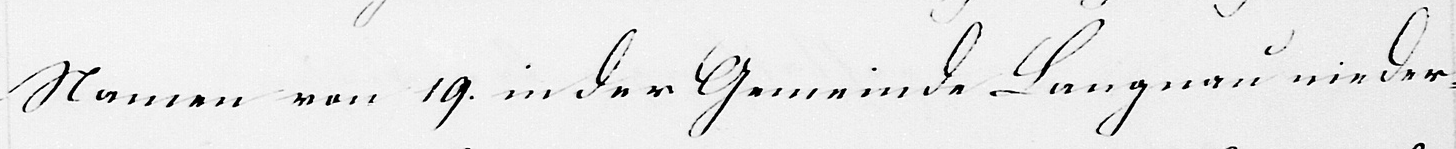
Namen von 19. in der Gemeinde Langnau nieder¬
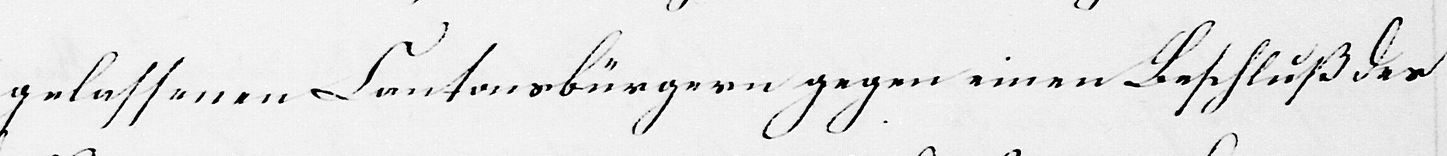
gelassenen Cantonsbürgern gegen einen Beschluß des
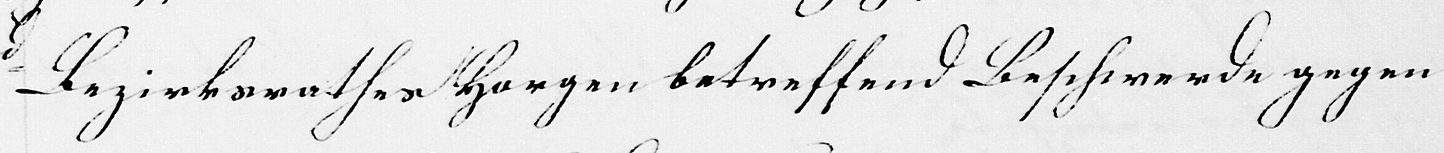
Bezirksrathes Horgen betreffend Beschwerde gegen
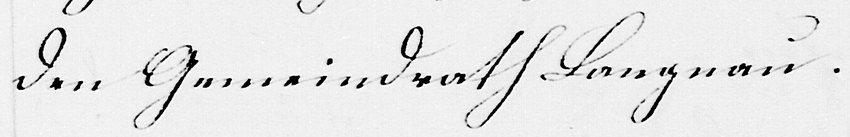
den Gemeindrath Langnau.
